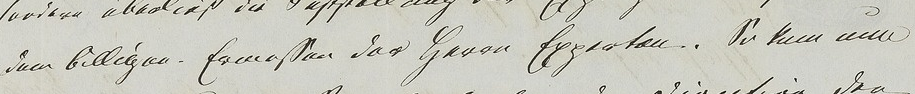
dem billigen Ermessen der Herrn Experten. So kam nur
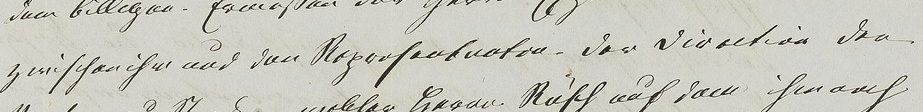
zwischen ihm und den Representanten der Direction der
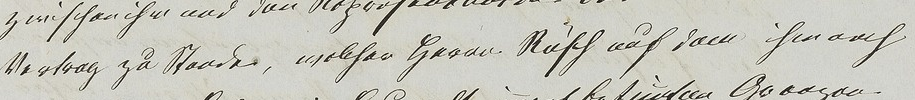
Vertrag zu Stande, welcher Herrn Rüsch auf dem ihm noch
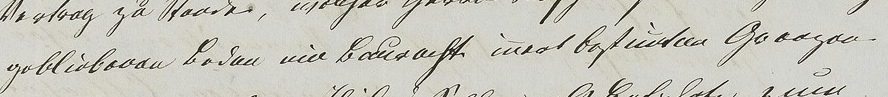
gebliebenen Boden ein Baurecht innert bestimmten Grenzen
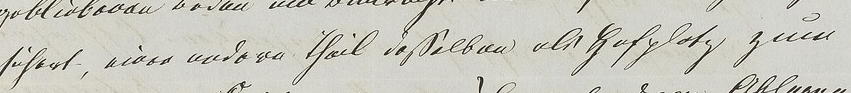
sichert, einen andern Theil desselben als Hofplatz zum
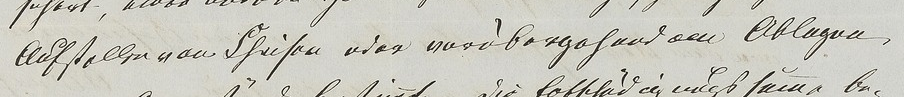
Aufstellen von Chaisen oder vorübergehendem Ablegen
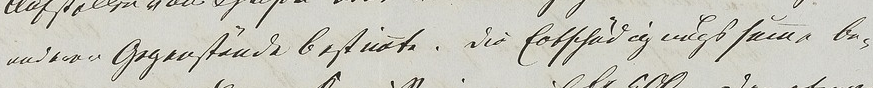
anderer Gegenstände bestimmte. Die Entschädigungssumme be-
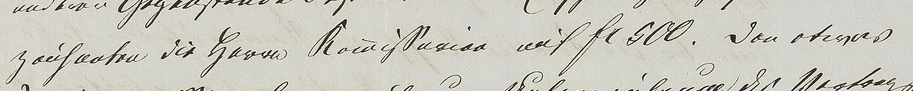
zeichneten die Herrn Kommissarien auf fr 500. Den etwas
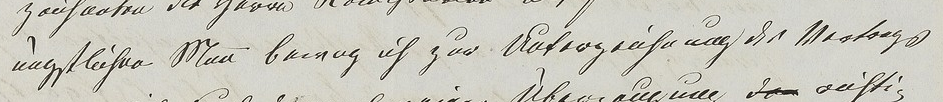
ängstlichen Mann bewog ich zur Unterzeichnung des Vertrags
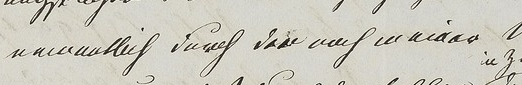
namentlich durch den nach meiner
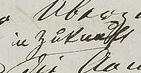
den richti-
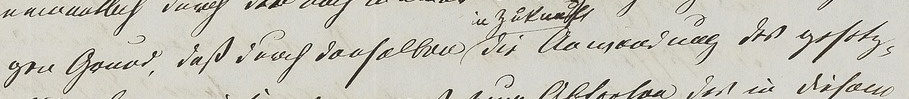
gen Grund, daß durch denselben in Zukunft die Anwendung des gesetz-
